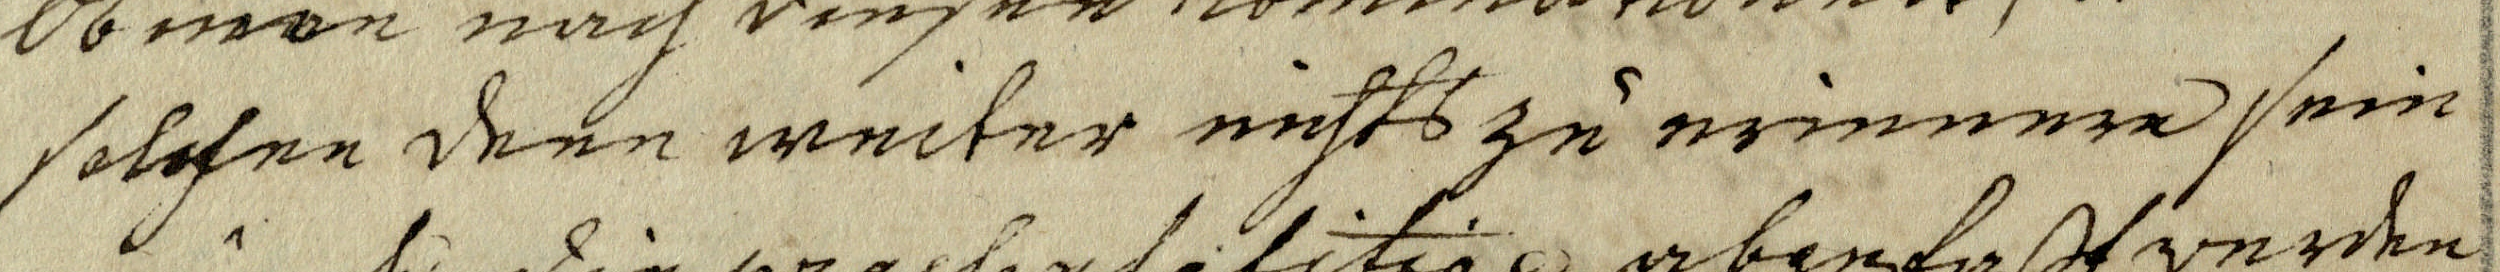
solchen denn weiter nichts zu erinnern sein
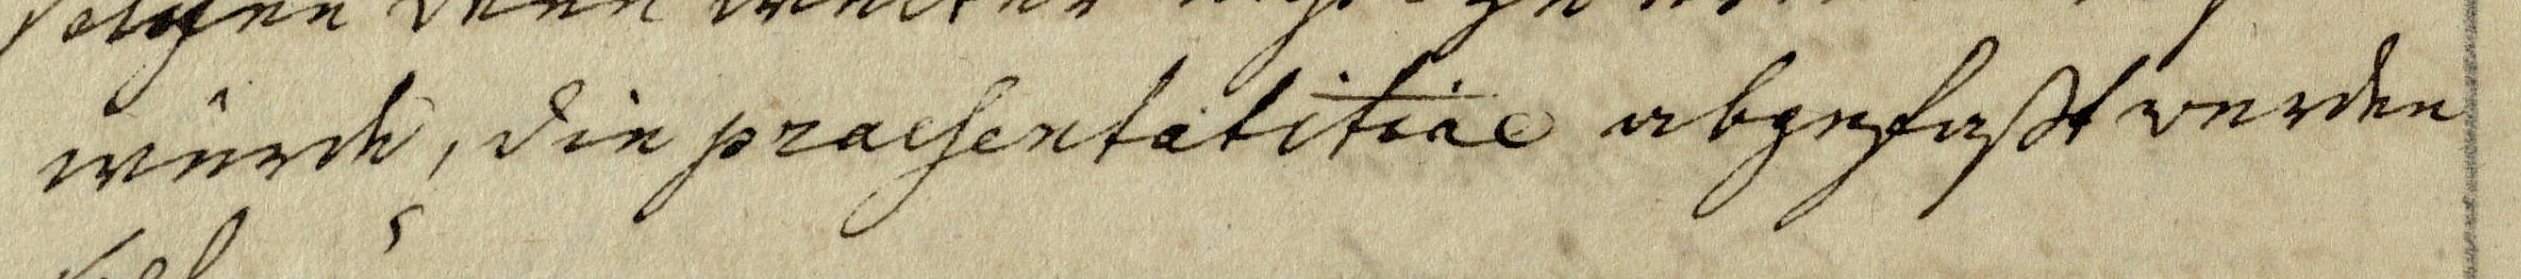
würde, die praesentatitiae abgefaßt werden
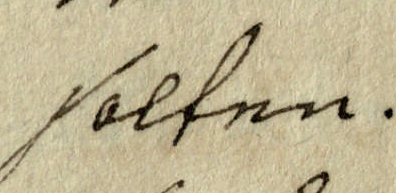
solten?
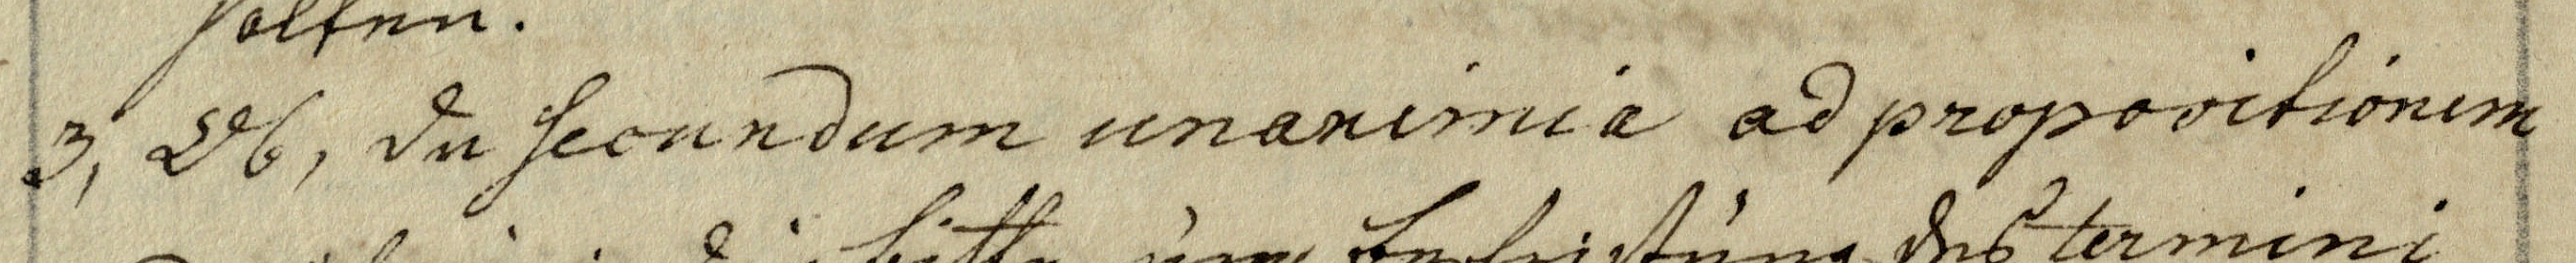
3, Ob, da secundum unanimia ad propositionem
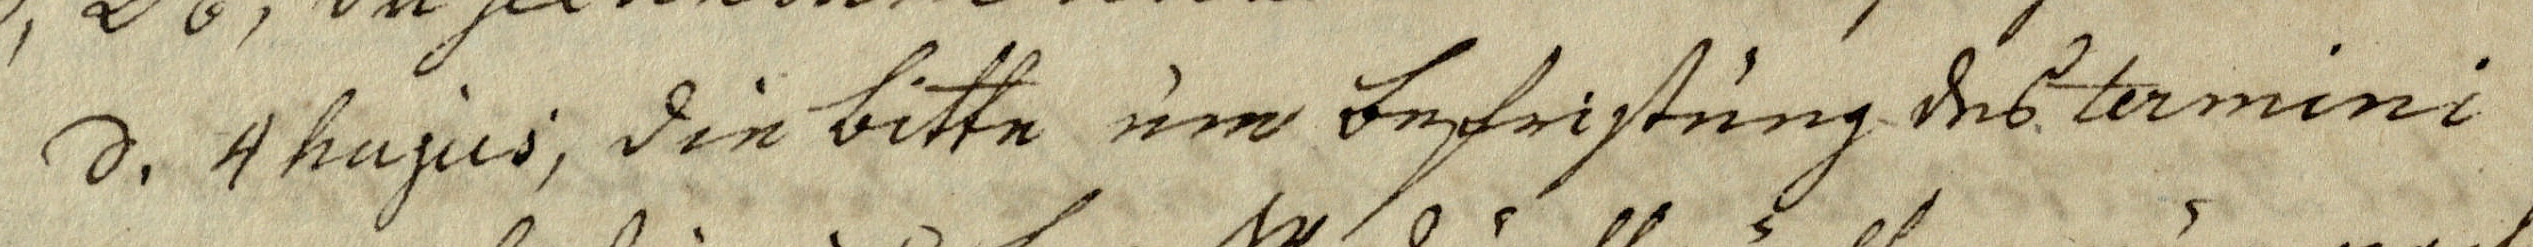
d. 4 hujus, die Bitte um Befristung des termini
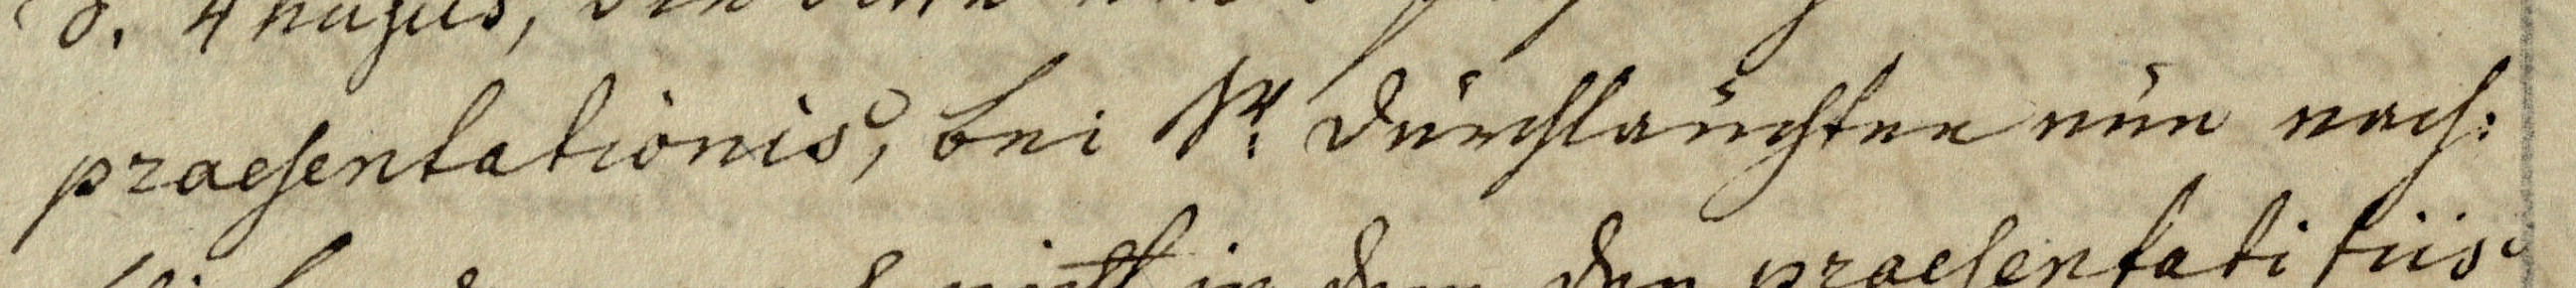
praesentationis, bei Sr Durchlauchten nun nach¬
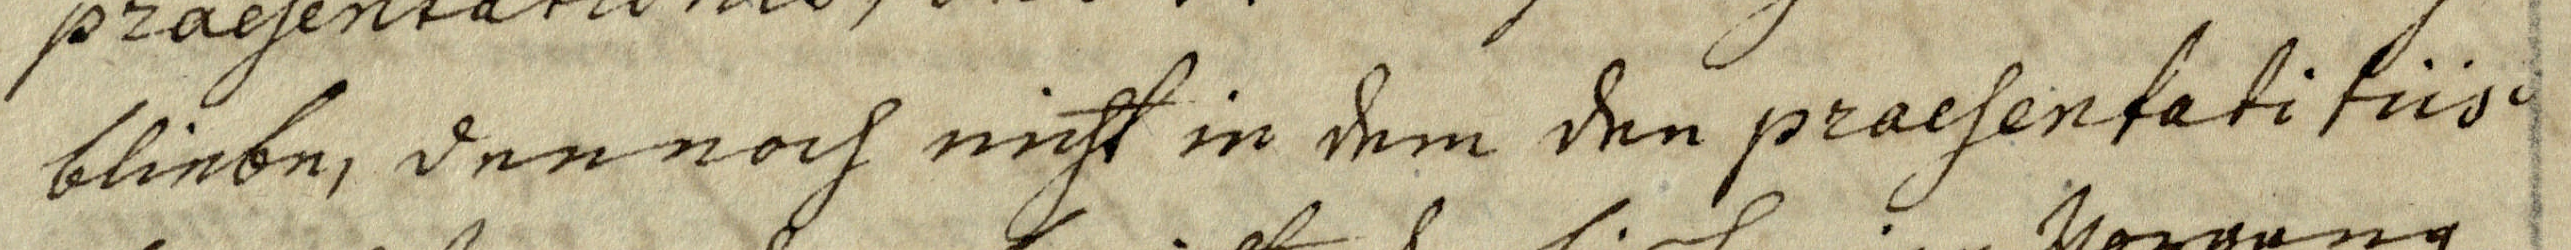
bliebe, dennoch nicht in dem den praesentatitiis
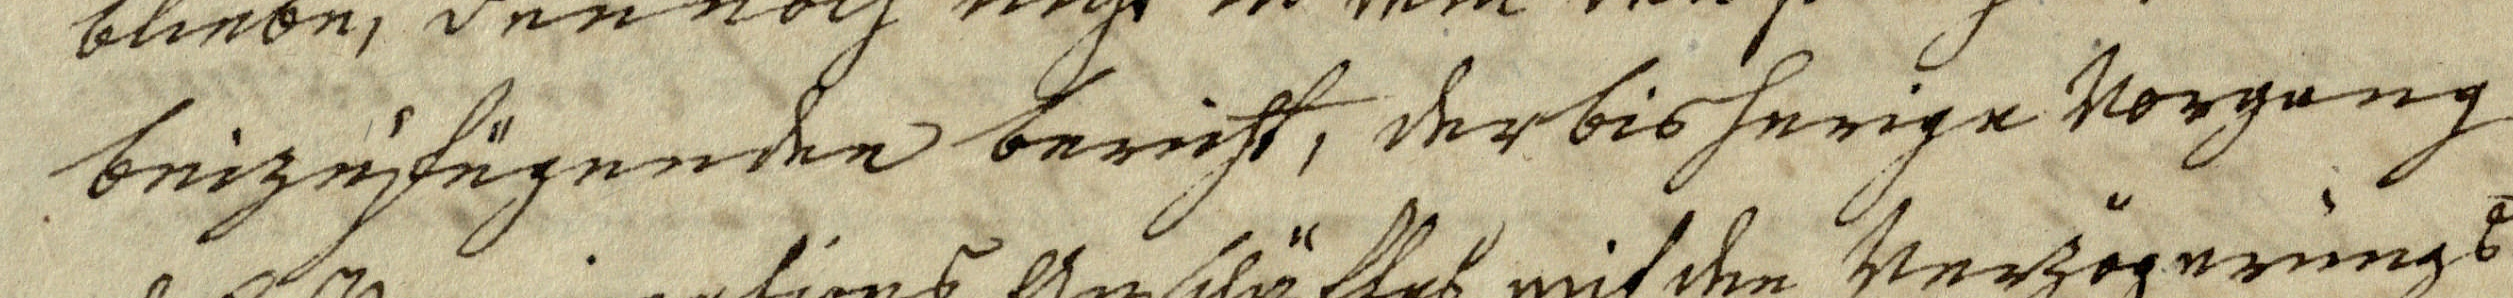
beizufügenden Bericht, derbisherige Vorgang
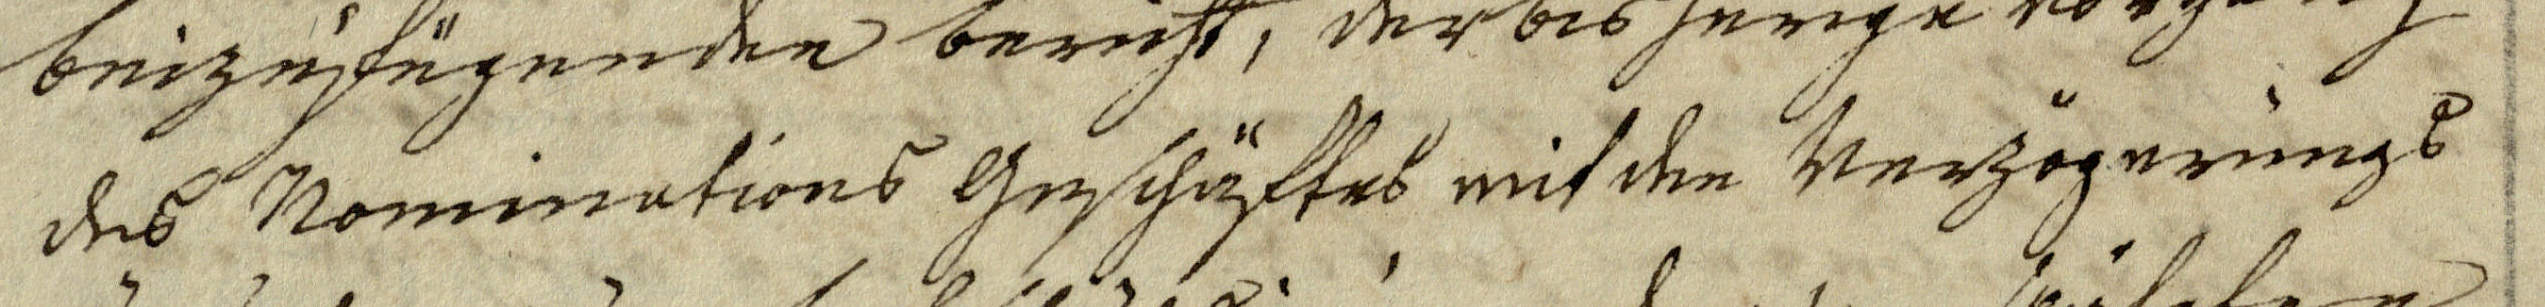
des Nominations Geschäftes mit den Nerzögerungs
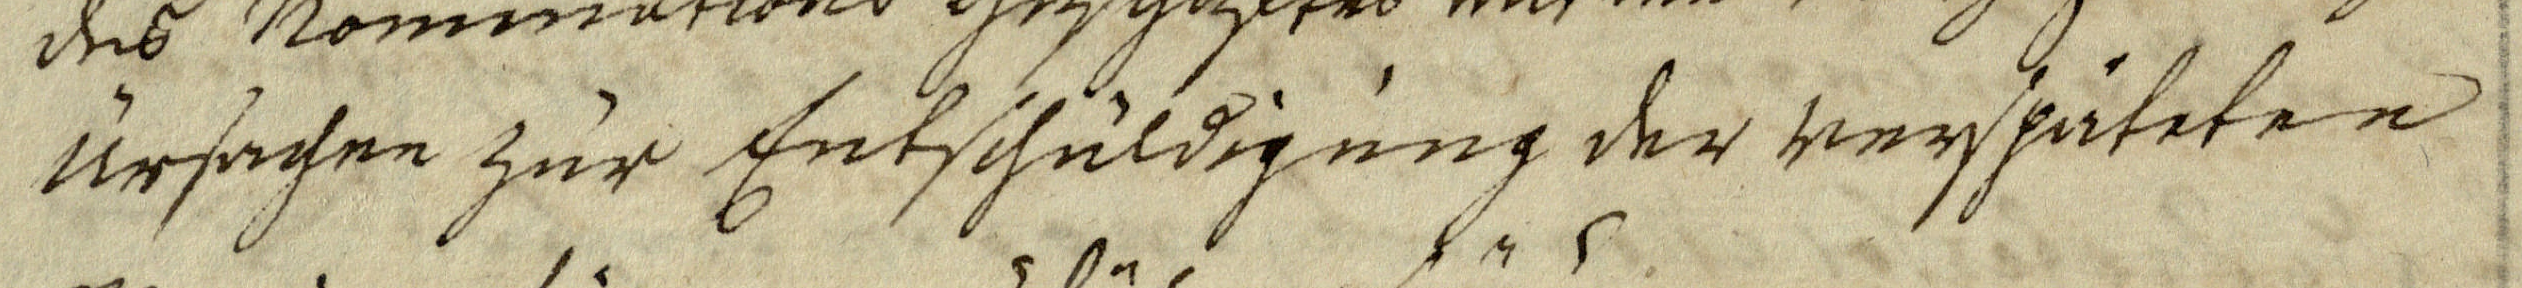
Ursachen zur Entschuldigung der verspäteten
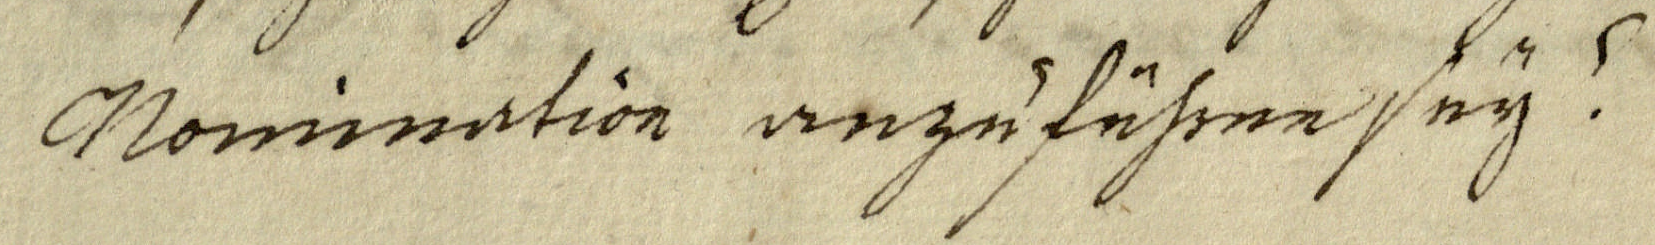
Nomination anzuführen seÿ?
